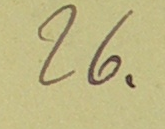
26
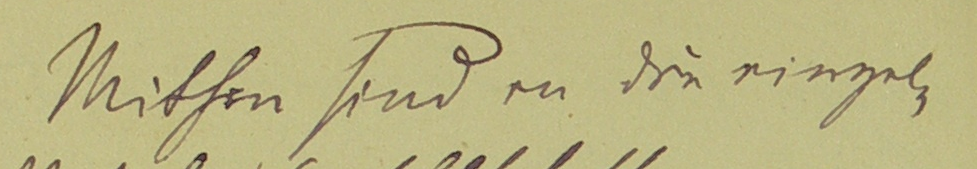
Mithin sind in den einzel¬
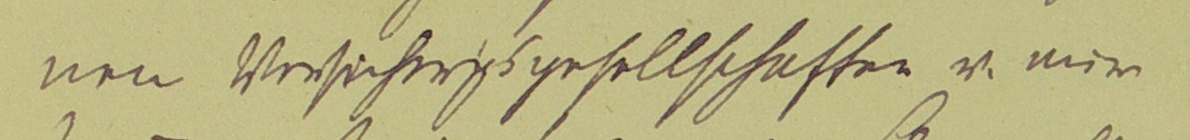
nen Versicherungsgesellschaften von mir
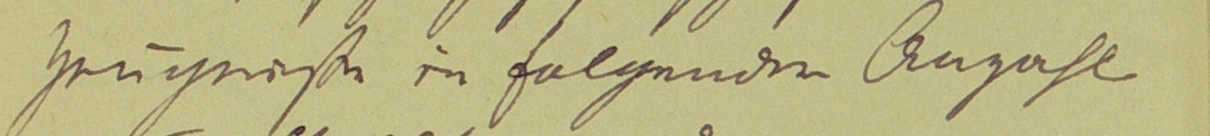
Zeugniße in folgender Anzahl
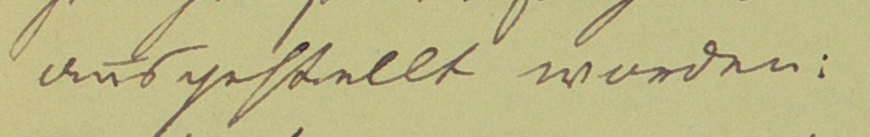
ausgestellt worden:
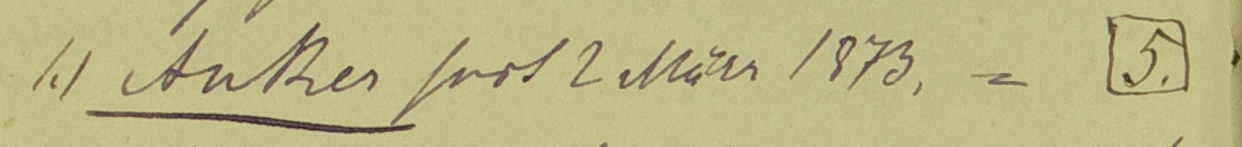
1) Anker seit 2 März 1873 = 5
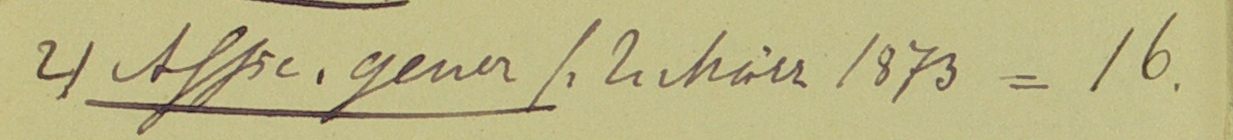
2) Assicur. Generali seit 2 März 1873 = 16
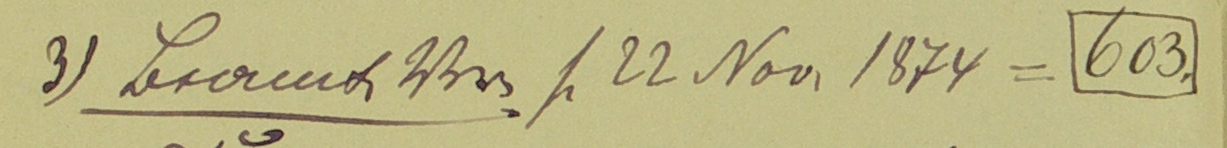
3) Beamten Versich. seit 22 Nov.1874 = 603
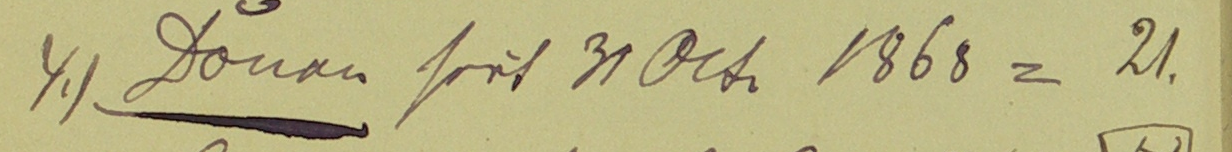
4) Donau seit 31 Octob.1868 = 21
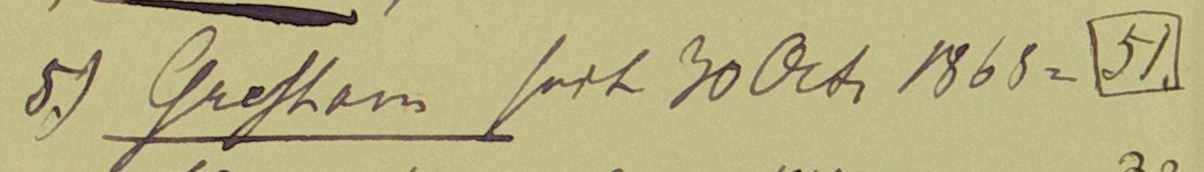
5) Hestony seit 30 Octob. 1868 = 51
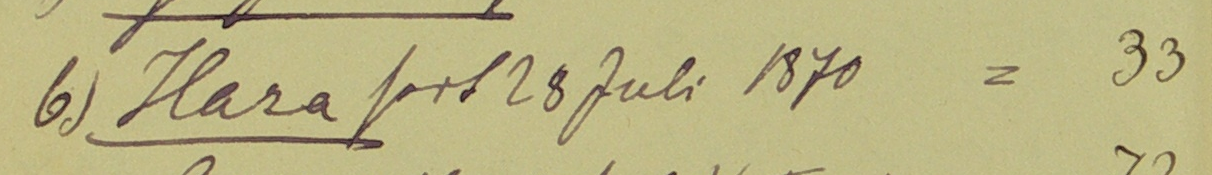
6) Tlara seit 28 Juli 1870 = 51
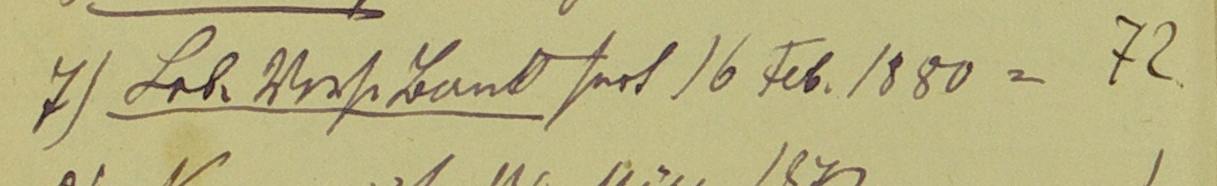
7) Lebens. Ver. Bank seit 16. Febr. 1870 = 33
